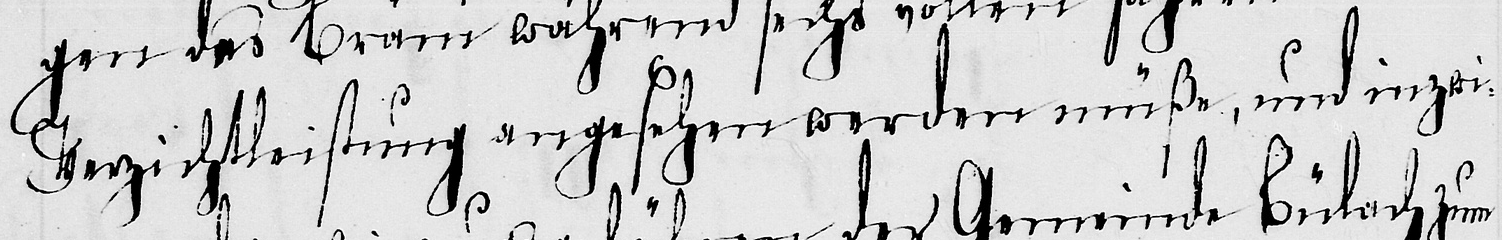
Verzichtleistung angesehen werden müße, und inzwi¬
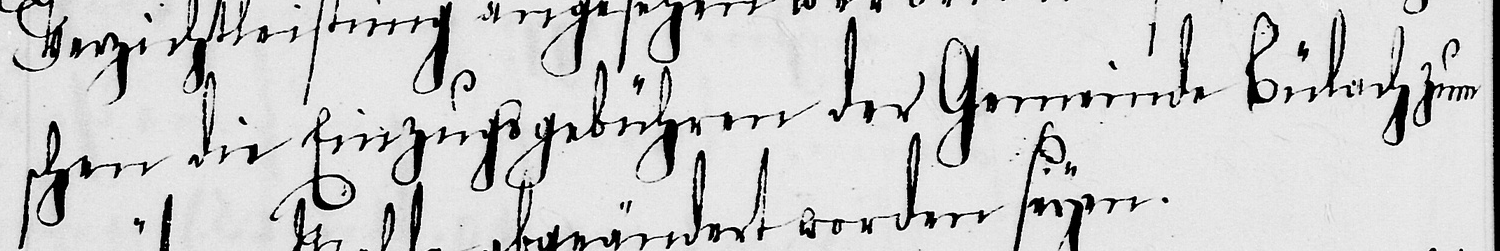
schen die Einzugsgebühren der Gemeinde Bülach zum
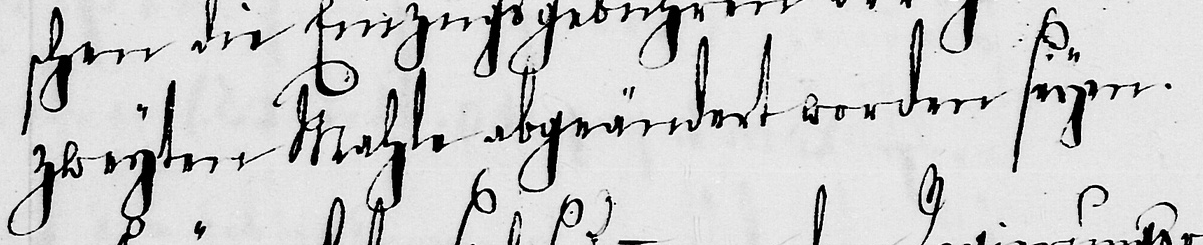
zweyten Mahle abgeändert worden seyen.
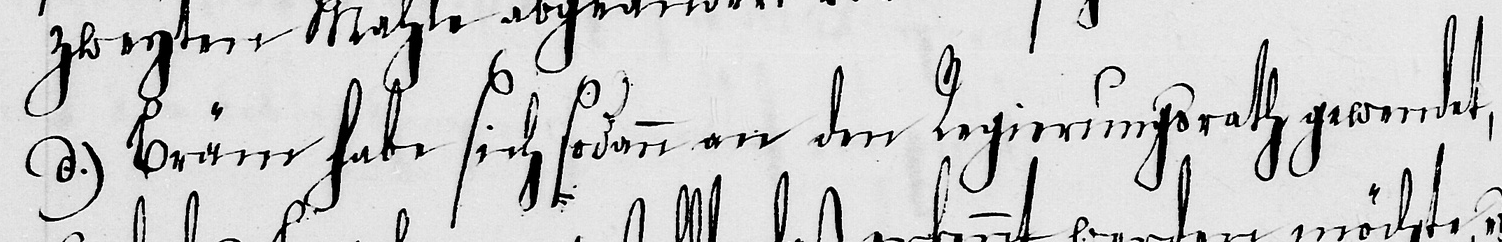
d.) Bräm habe sich sodann an den Regierungsrath gewende¬
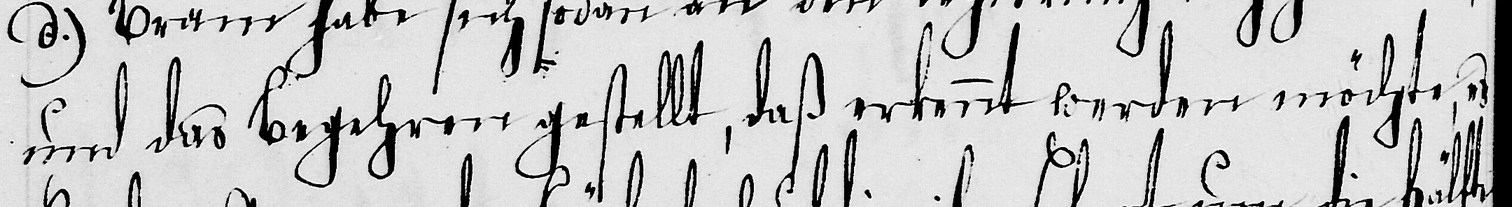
und das Begehren gestellt, daß erkennt werden möchte,
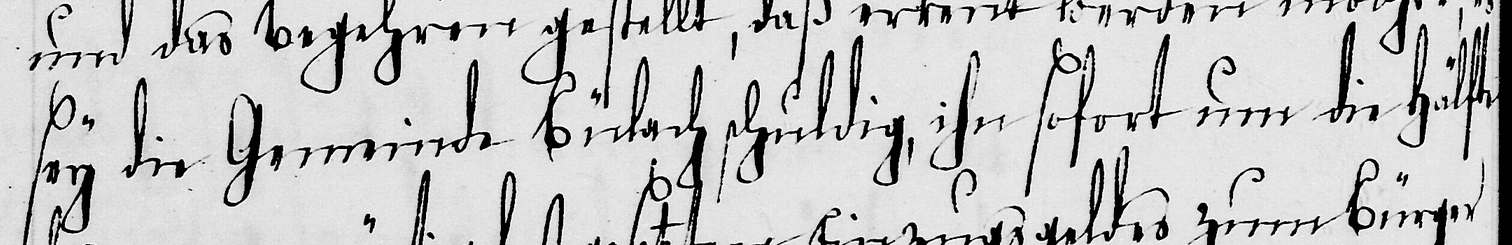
ey die Gemeinde Bülach schuldig, ihn sofort um die
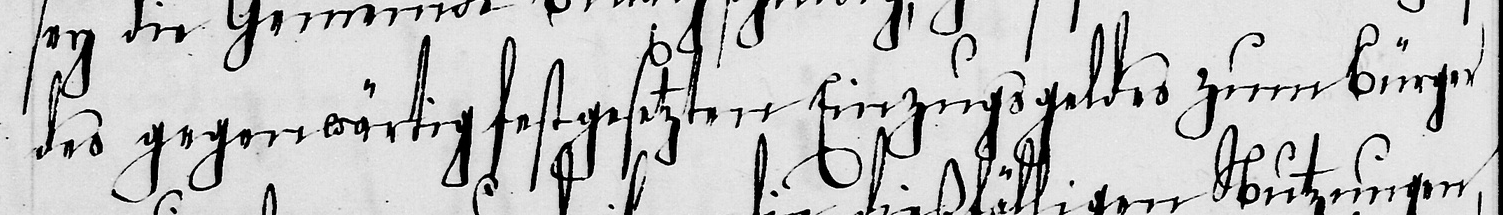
des gegenwärtig gesetzten Einzugsgeldes zum Bürger
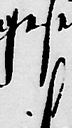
t,
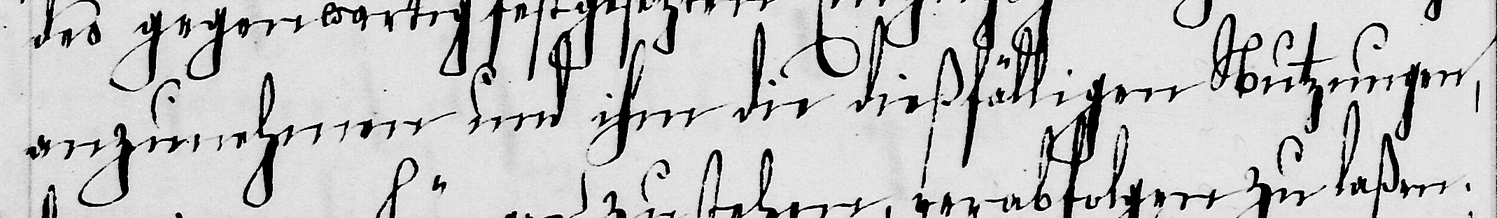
anzunehmen und ihm die dießfälligen Nutzungen,
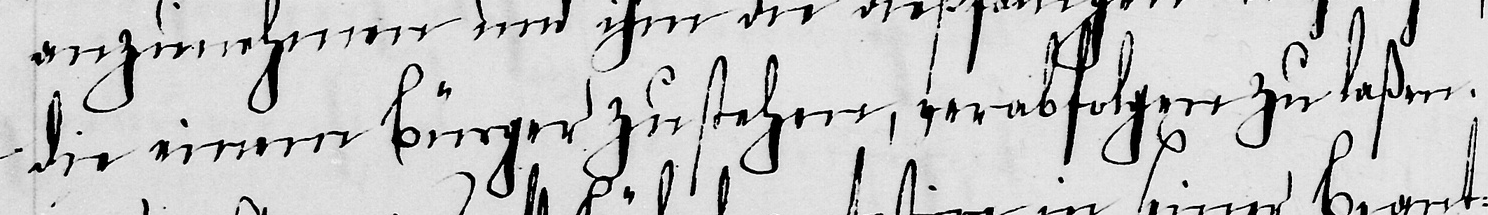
die einem Bürger zustehen, verabfolgen zu laßen.
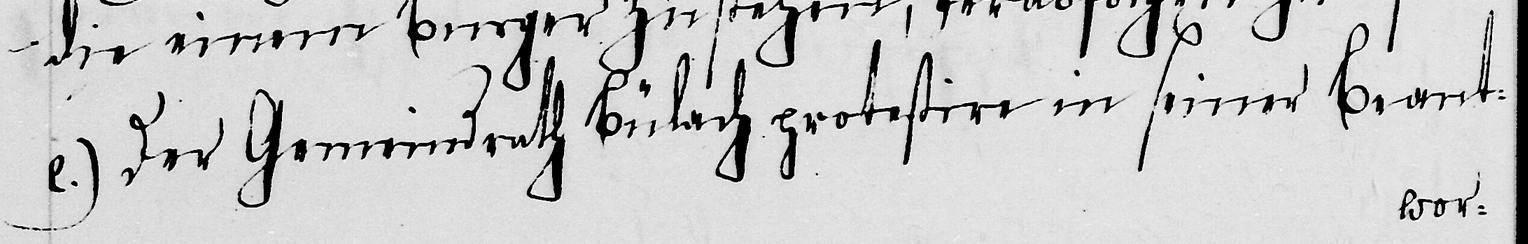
e.) Der Gemeindrath Bülach protestire in seiner Beant-
